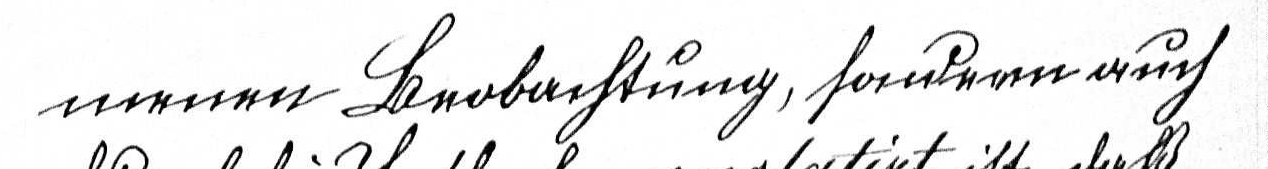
menen Beobachtung, sondern auch
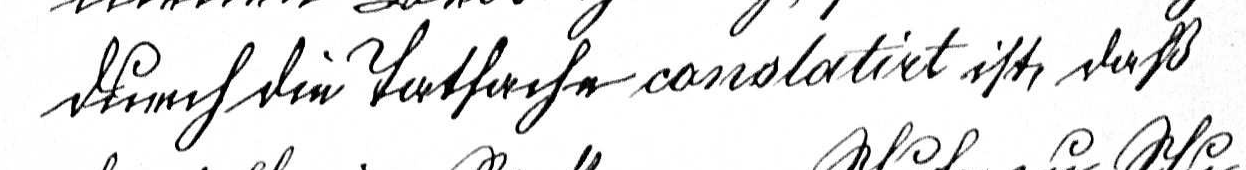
durch die Tatsache constatirt ist, daß
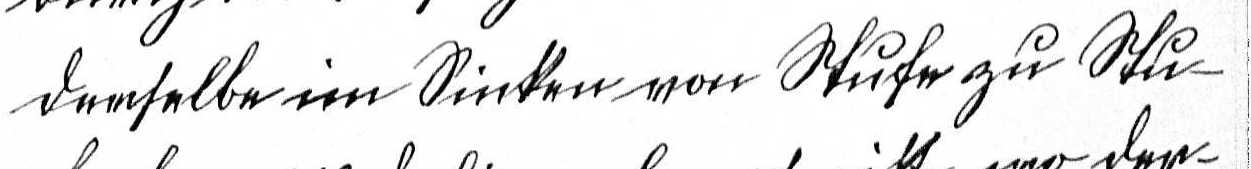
derselbe im Sinken von Stufe zu Stu¬
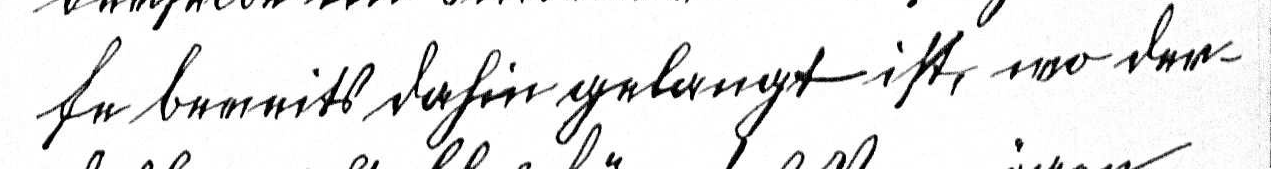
fe bereits dahin gelangt ist, wo der¬
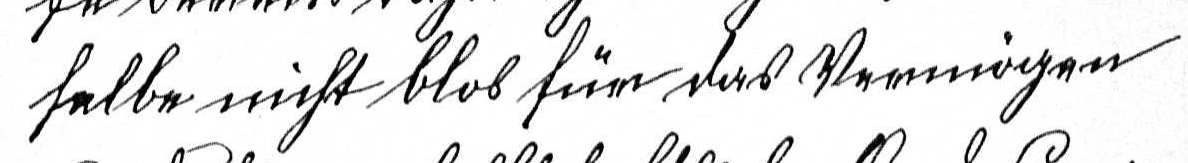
selbe nicht blos für das Vermögen
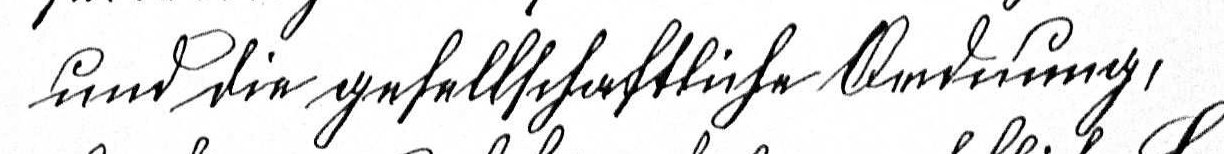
und die gesellschaftliche Ordnung,
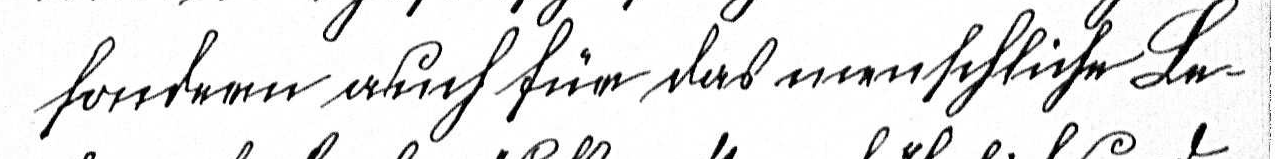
sondern auch für das menschliche Le¬
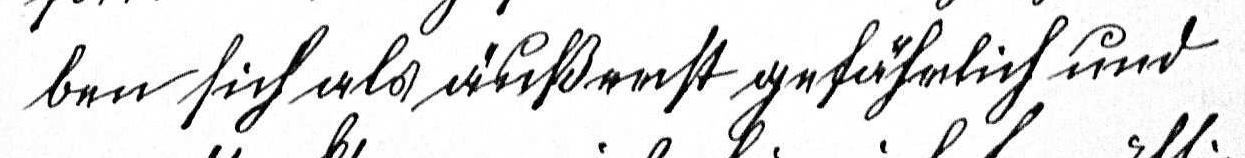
ben sich als äußerst gefährlich und
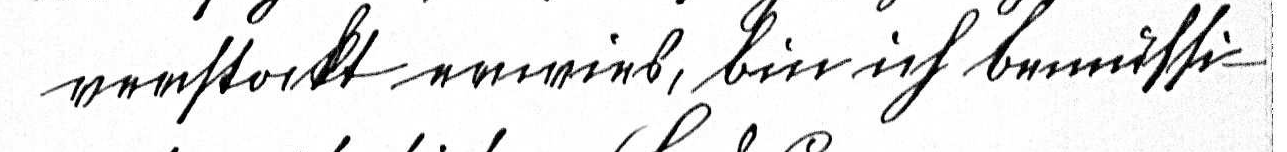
verstockt erwies, bin ich bemüssi¬
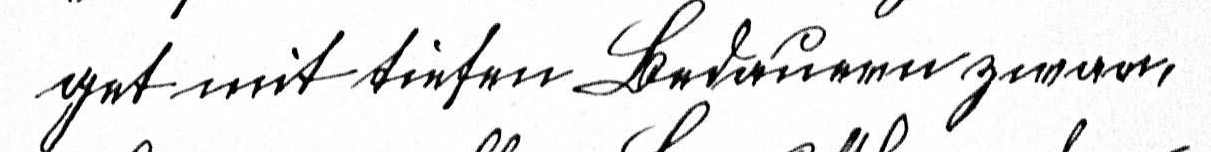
get mit tiefen Bedauern zwar
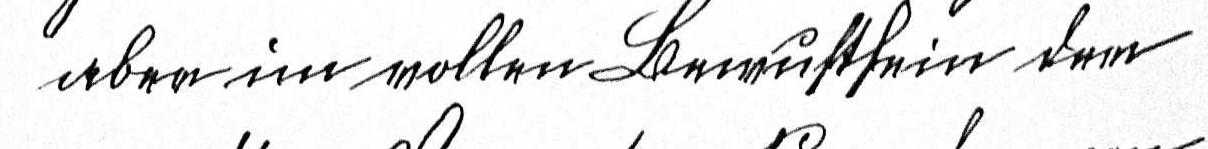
aber im vollen Bewustsein der
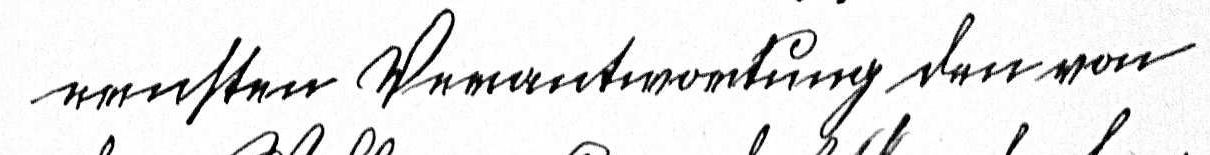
ernsten Verantwortung den von
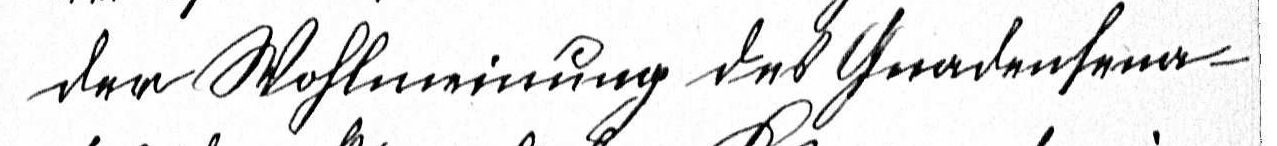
der Wohlmeinung des Gnadensena¬
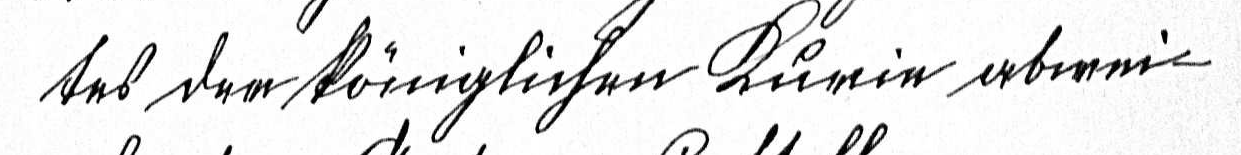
tes der königlichen Kurie abwei¬
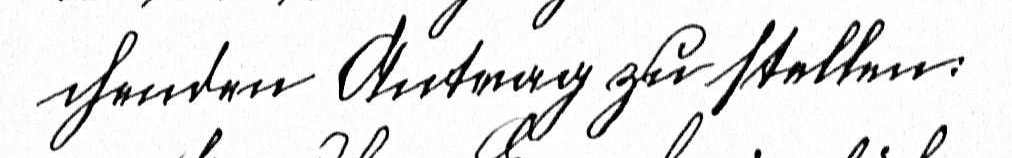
chenden Antrag zu stellen:
